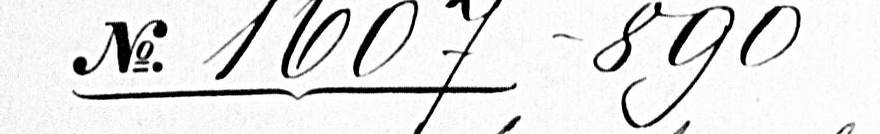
Nr. 1607-890
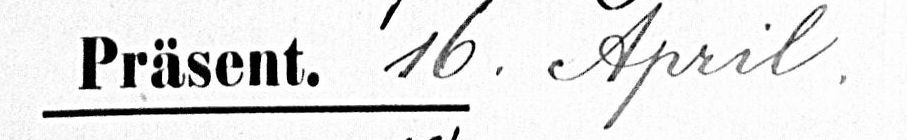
Präsent. 16. April.
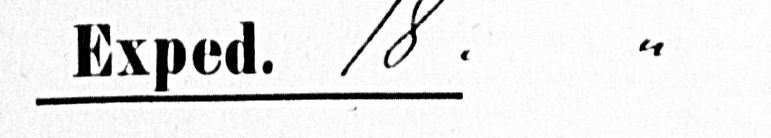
Exped. 18. April.
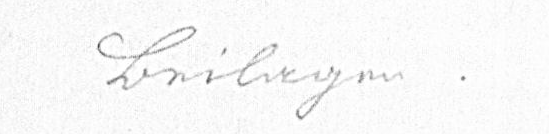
Beilage.
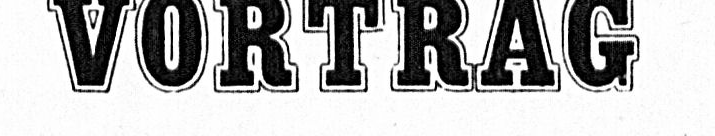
VORTRAG
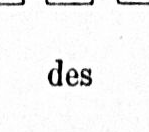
des
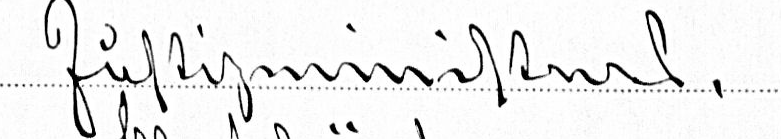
Justizministers,
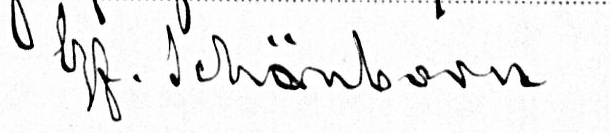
Gf. Schönborn
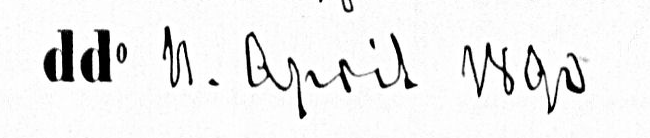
dd° 11. April 1890
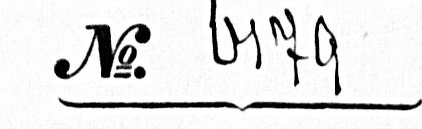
Nr. 6179
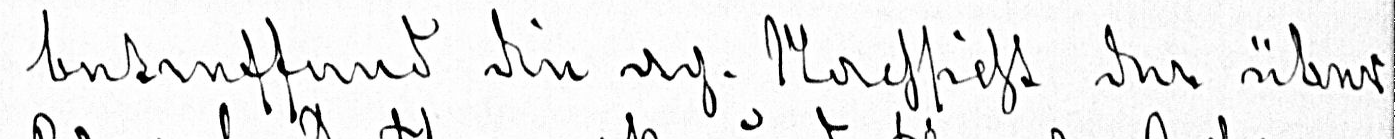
betreffend die ag. Nachsicht den über
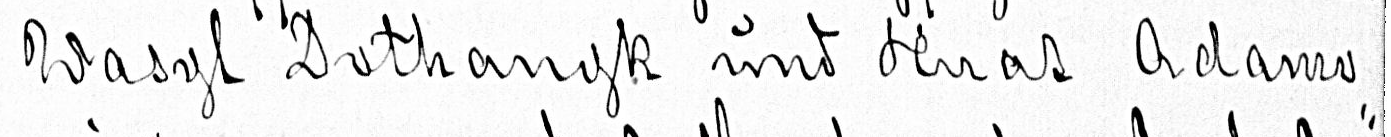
Wasyl Dothanyk und Hnat Adamo¬
